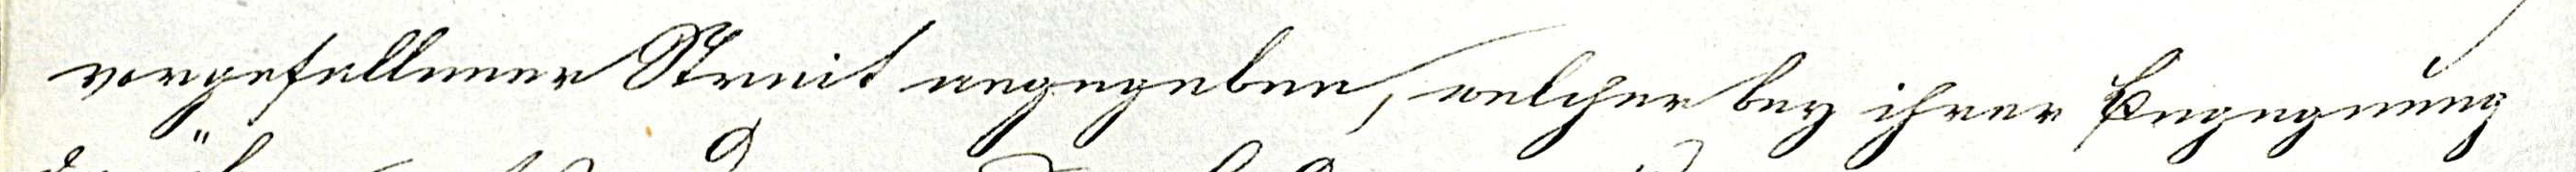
vorgefallener Streit angegeben, welcher bey ihrer Begegnung
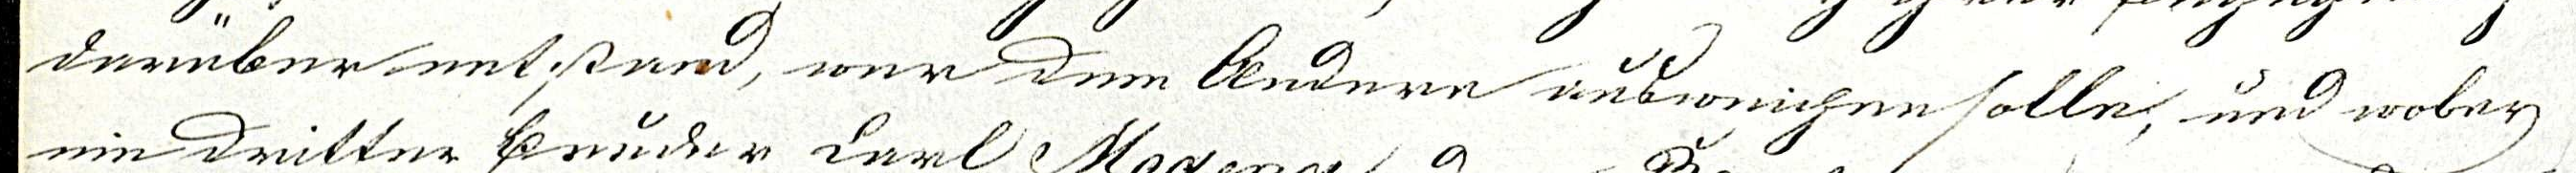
darüber entstand, wer dem Andere ausweichen solle, und wobey
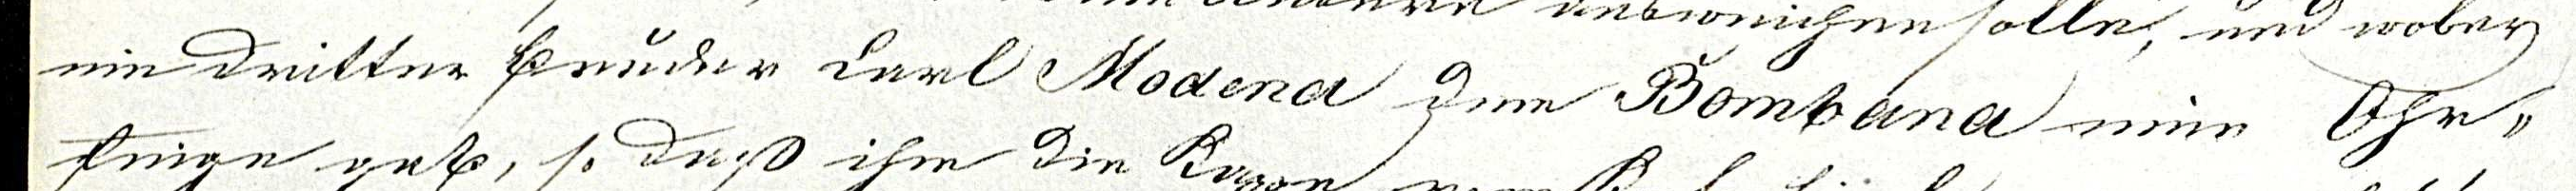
ein dritter Bruder Carl Modena dem Bombana eine Ohr¬
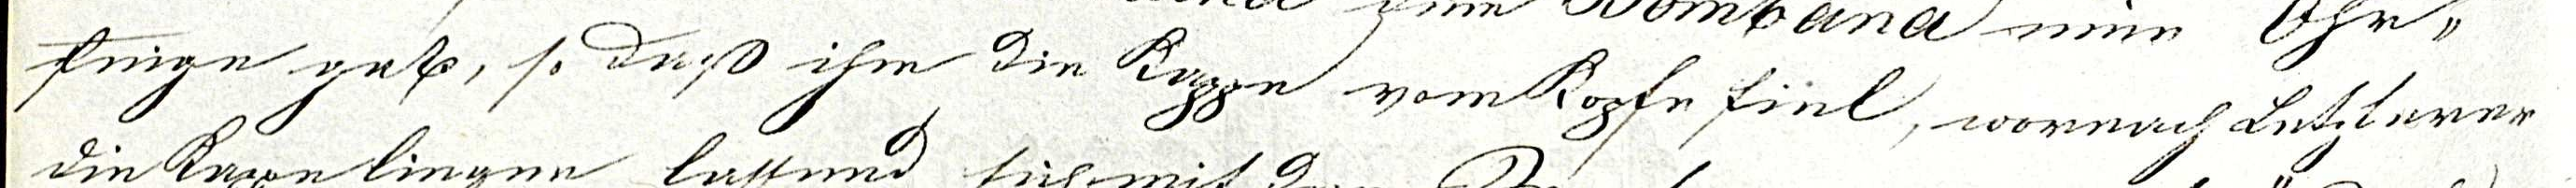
xxinge gab, so daß ihm die Kappe vom Kopfe xx, wornach Letzterer
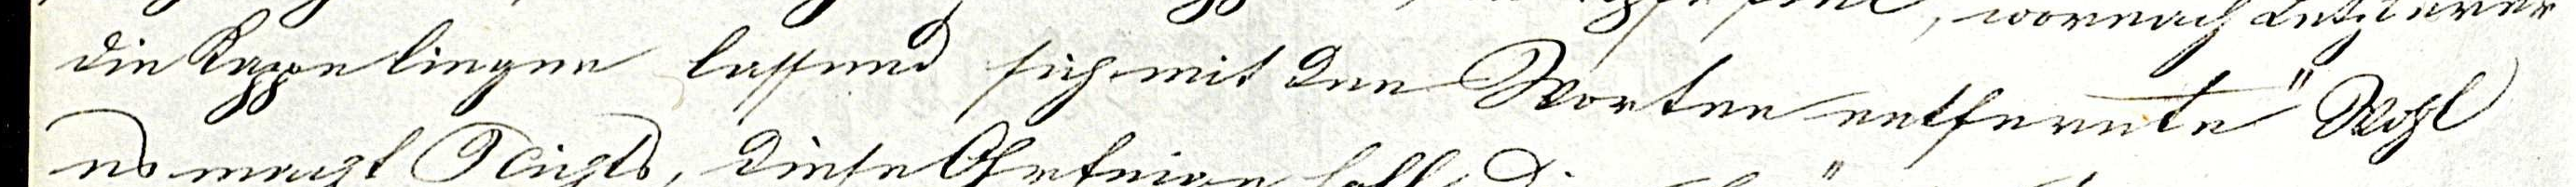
die Kappe liegen lassend sich mit den Worten entfernte" Wohl
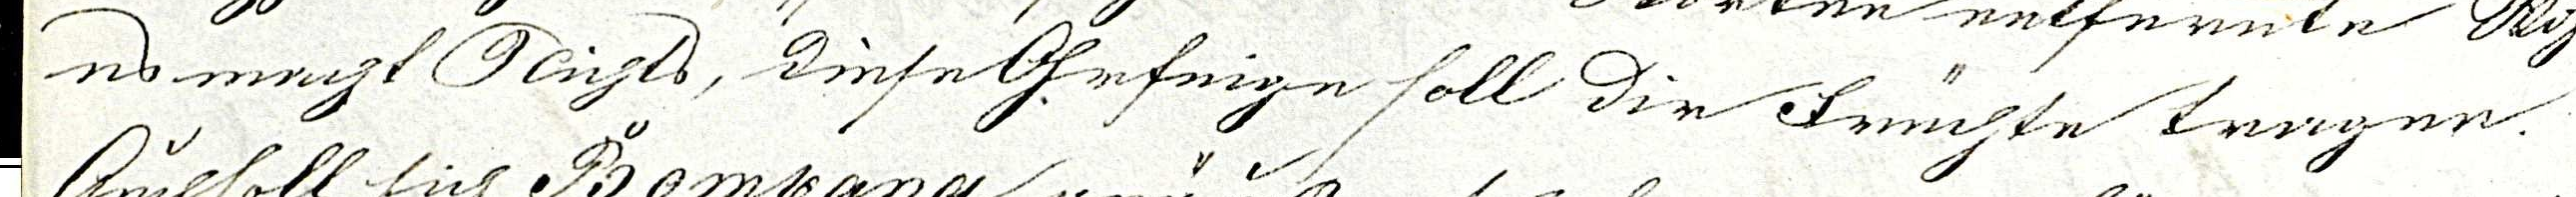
es macht Nichts, diese Ohrfeige soll die Früchte tragen.
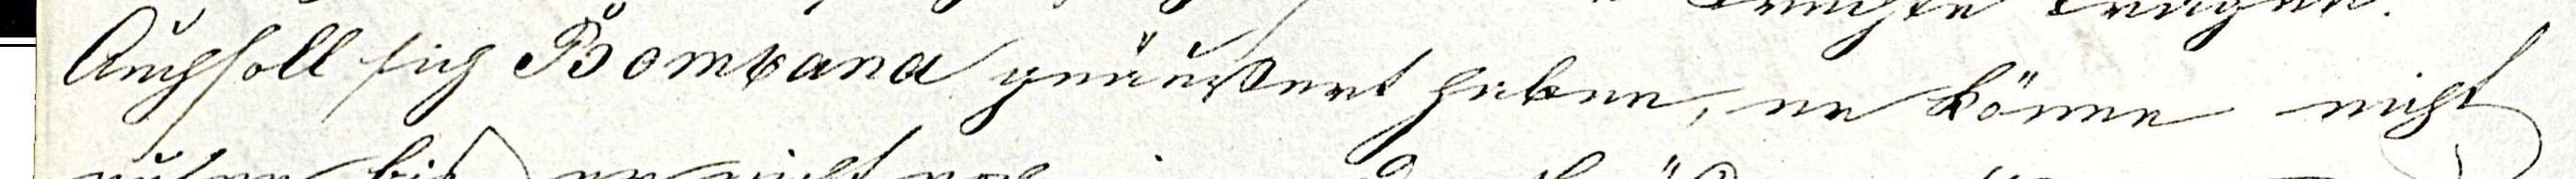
Auch soll sich Bombana geäußert haben, er könne nicht
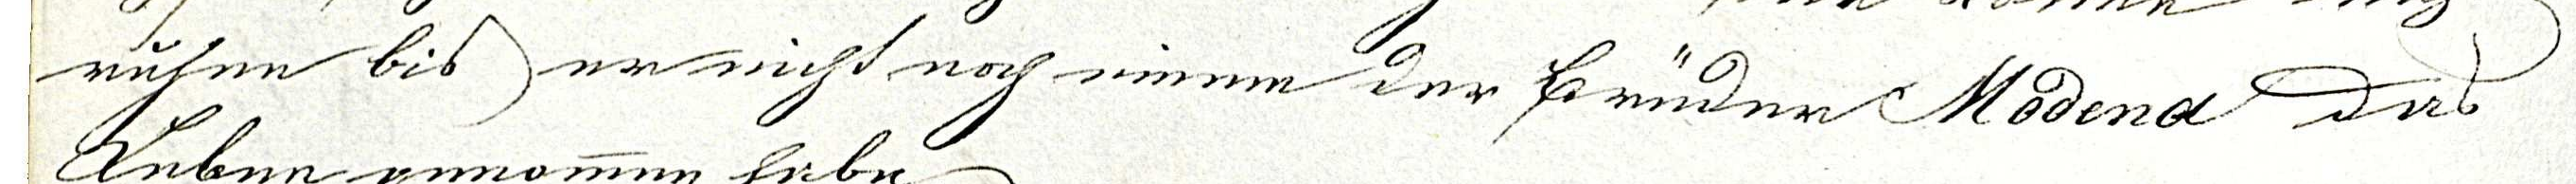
ruhen bis er nicht noch einem der Brüder Modena das
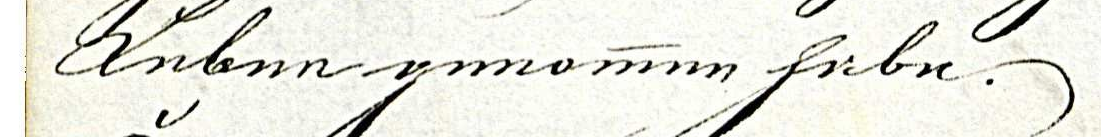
Leben genommen habe.
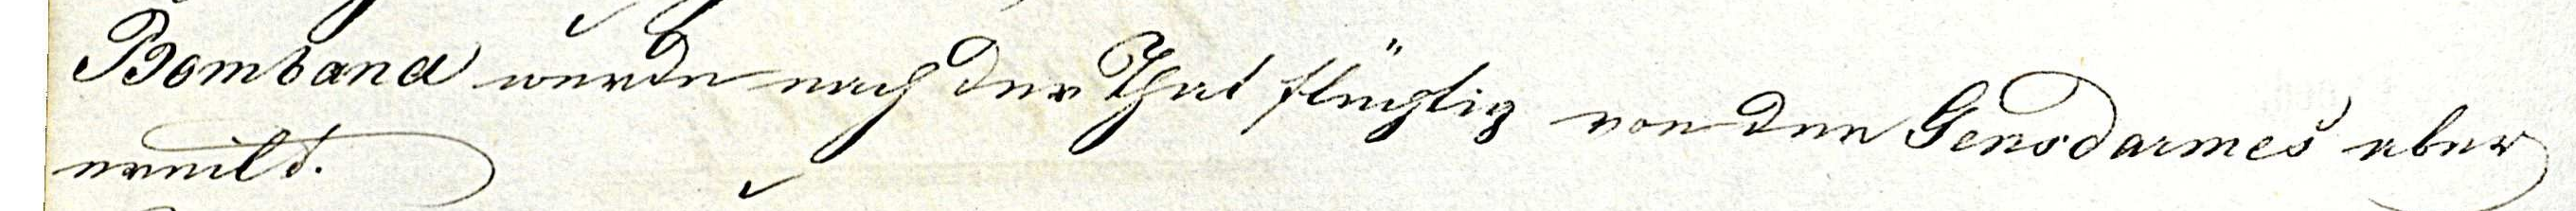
Bombana wurde nach der That flüchtig von den Gensdarmes aber
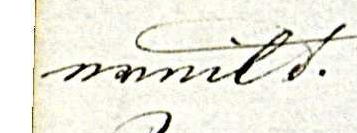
ereilt.
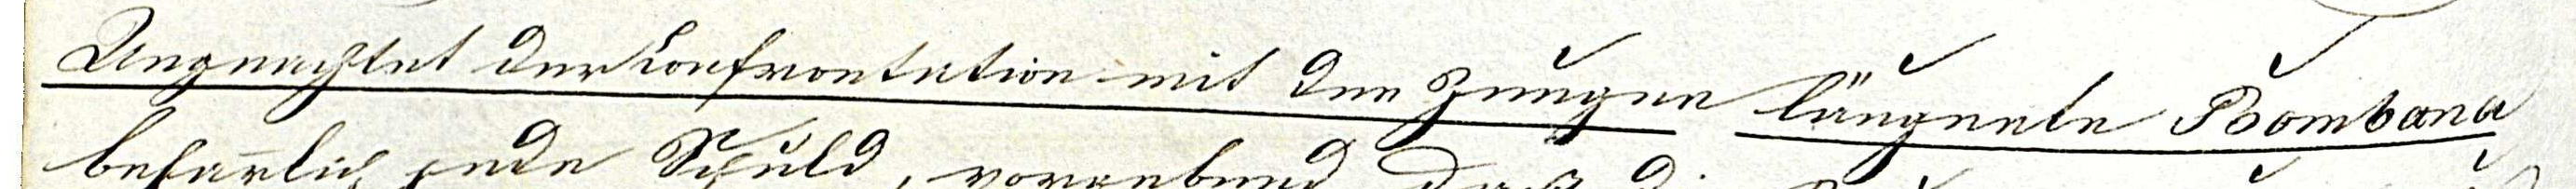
Ungeachtet der Confrontation mit den Zeugen längente Bombana
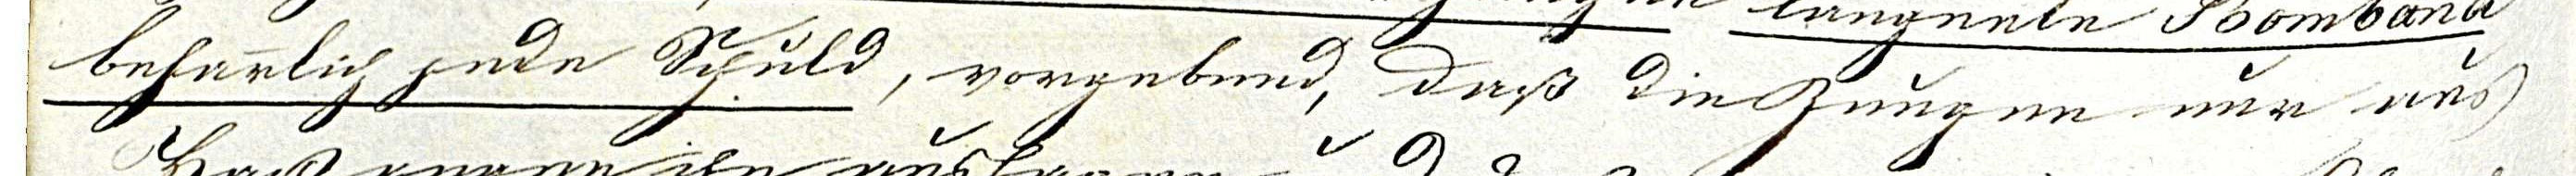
beharrlich jede Schuld, vorgebend, daß die Zungen nur aus
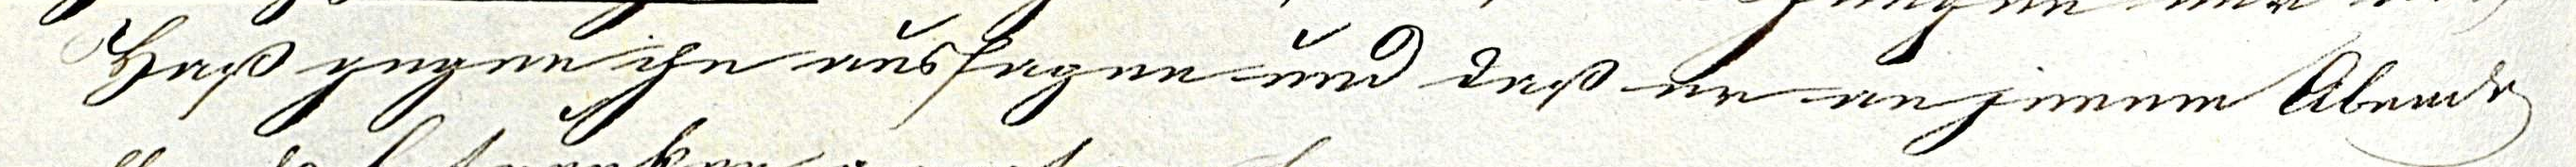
Haß gegen ihn aussagen und daß er an jenem Abende
